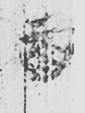百
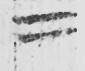二
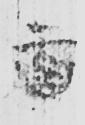百
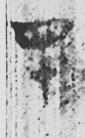{四十}
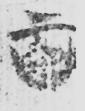百
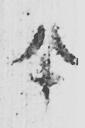{八十}
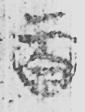百
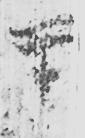{二十}
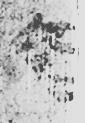六十=
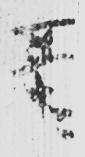五十=
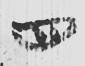四
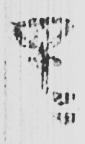四十=
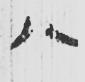八
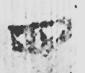四
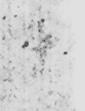十
